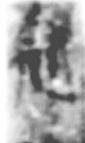卿
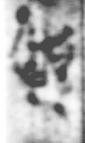事（士）
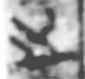之
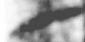一
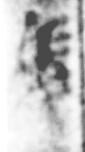○（牡）
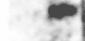一
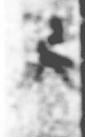黃
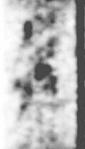○（牡）
